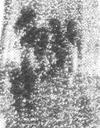紛
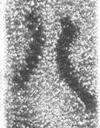八
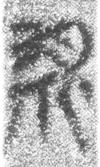○（明）
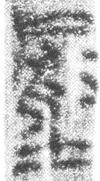童
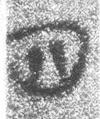四
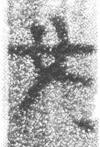戈
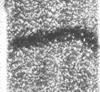一
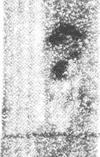厀（漆）
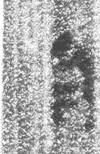青
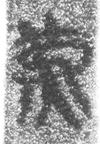黃
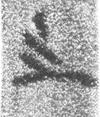之
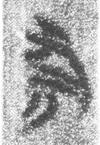○（畫）
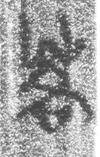茖
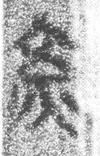炭
